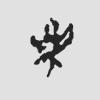味
